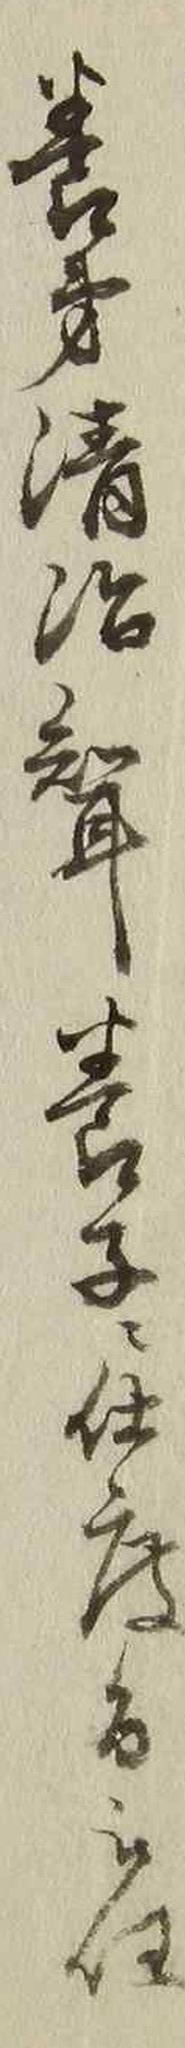養弟清治婿養子仕ニ仕度旨被任
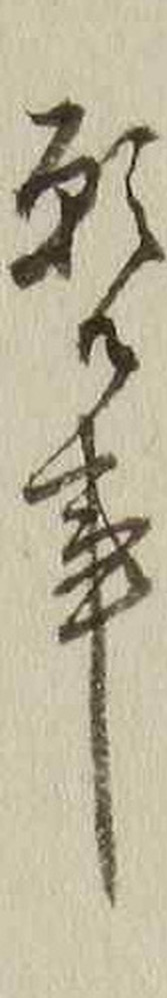願候事
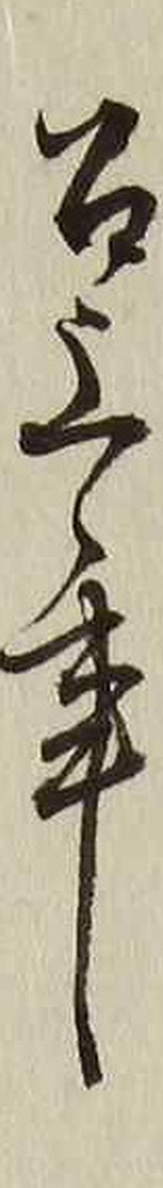召上候事
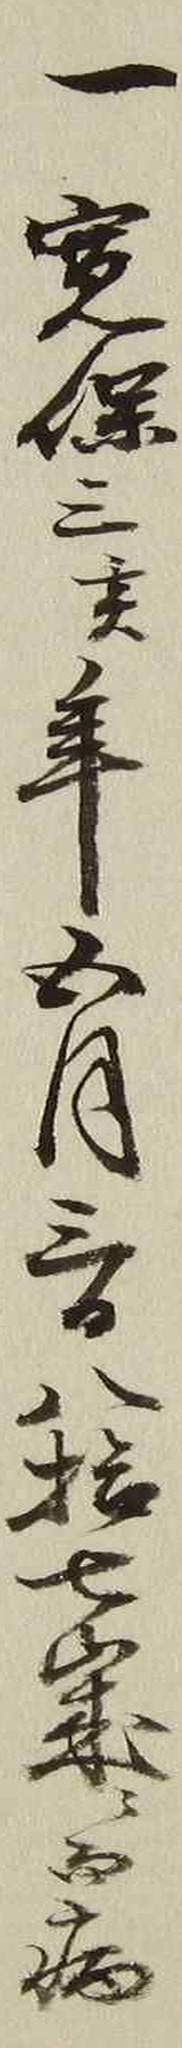一寛保三亥年五月三日八拾七歳ニ而病
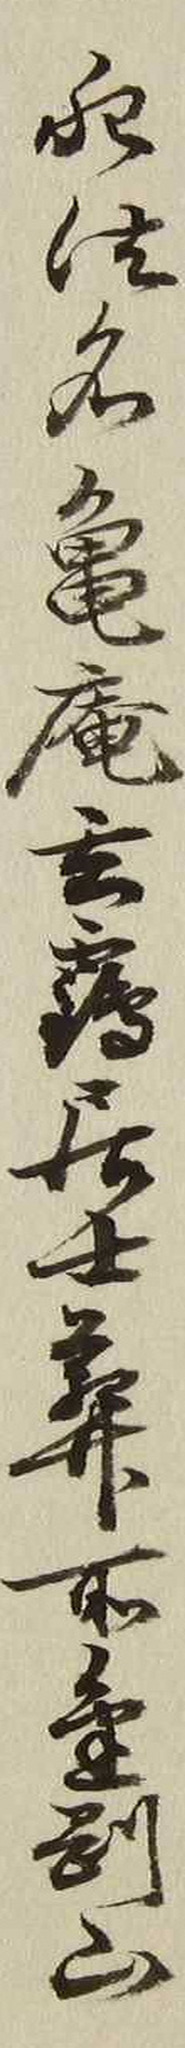死法名亀庵玄鶴居士葬所金到山
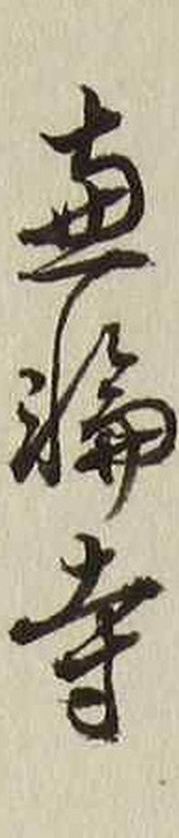恵輪寺
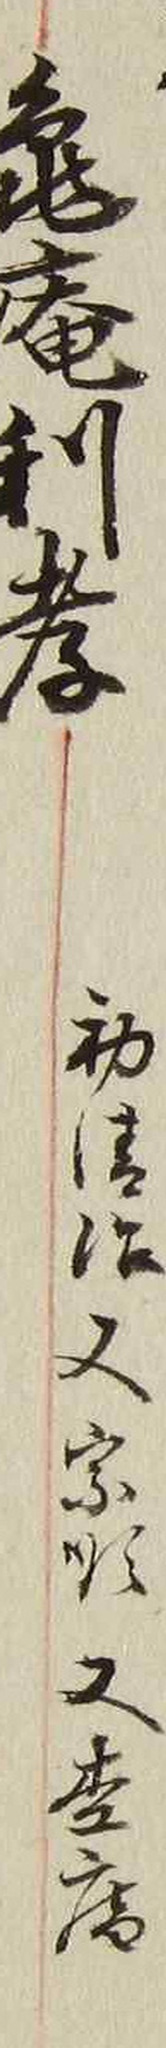亀庵利孝初清治又宗順又杢庵
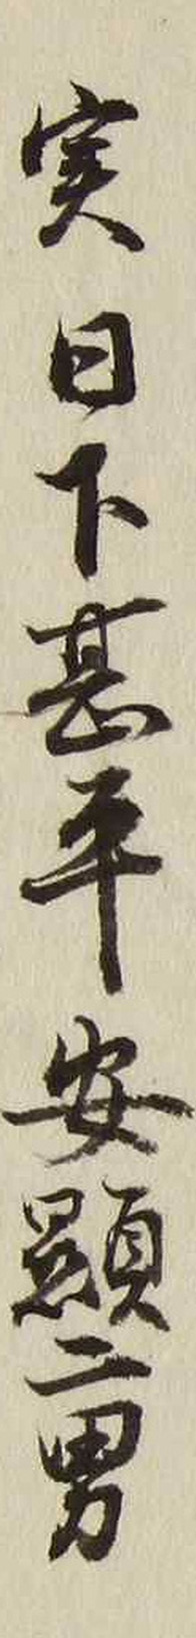実日下甚平安顕二男

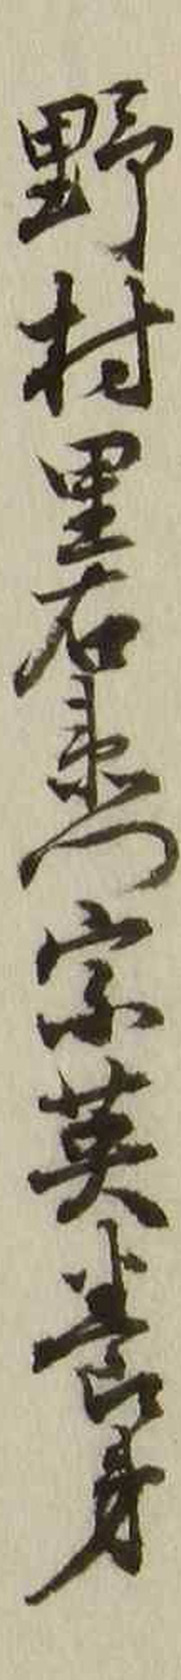野村里右衛門宗英養第
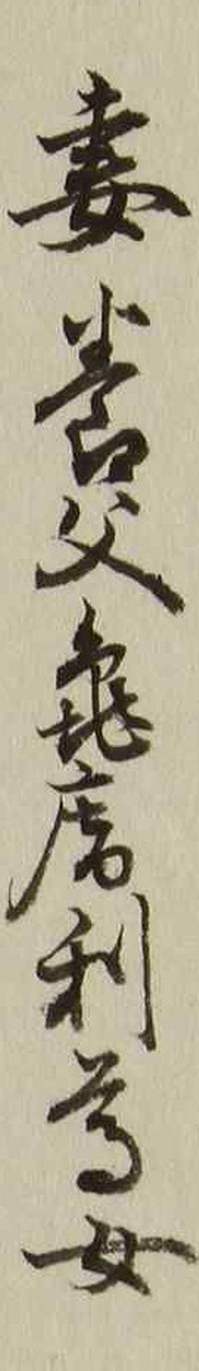妻養父亀庵利尊女
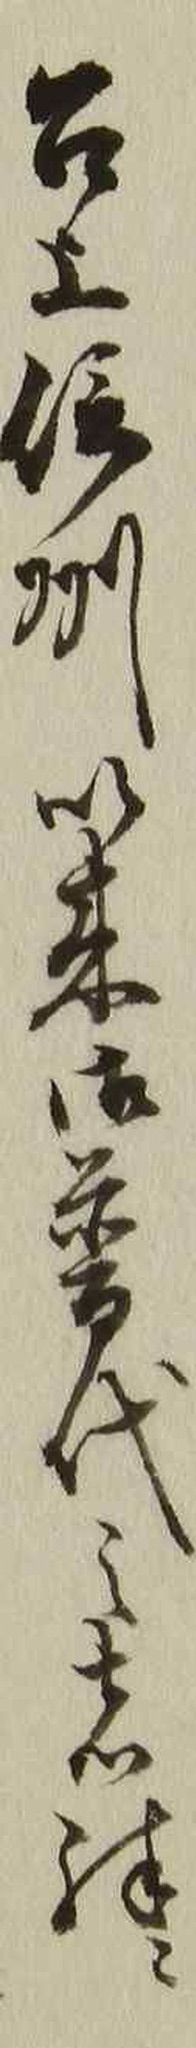召上信州以来御普代之者殊ニ
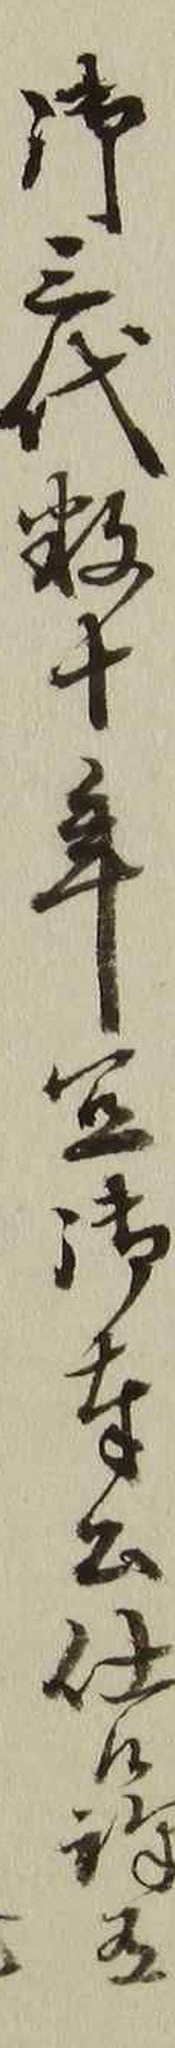御三代数十年宜御奉公仕候訳有
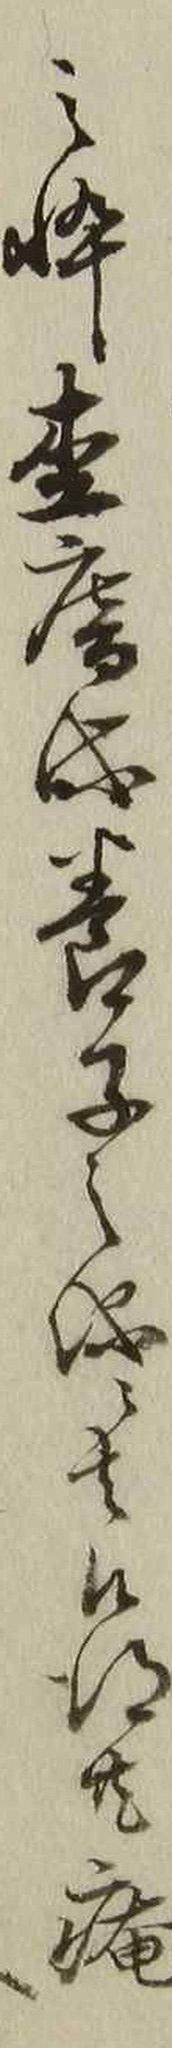之忰杢庵儀養子之儀ニ者候得共庵
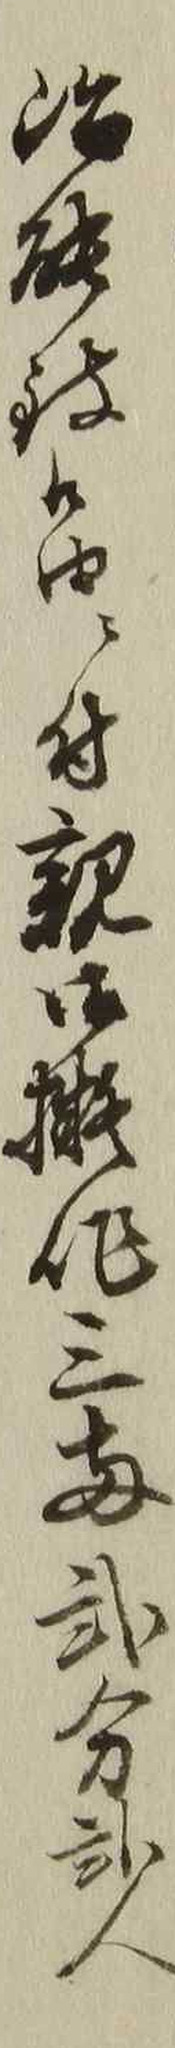治能致候由ニ付親御擬作三両弐分弐人
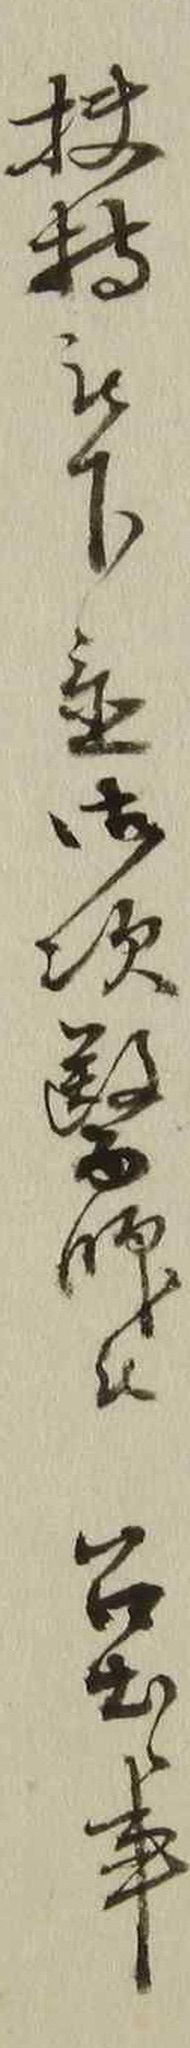扶持被下置御次医師被召出候事
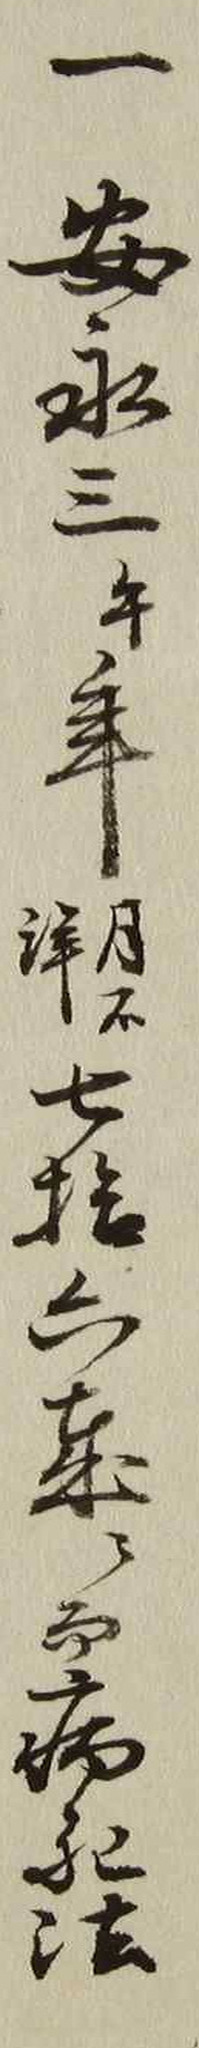一安永三午年月不詳七拾六歳ニ而病死法
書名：諸士系譜　巻之39　は之部7
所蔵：会津若松市立会津図書館
